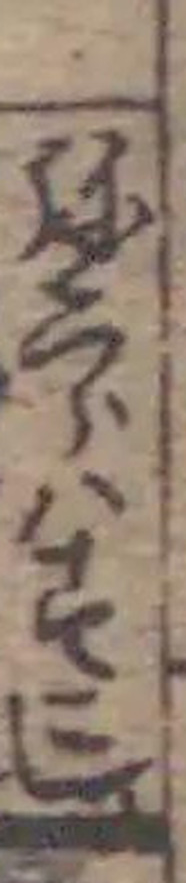弥二郎はすこし
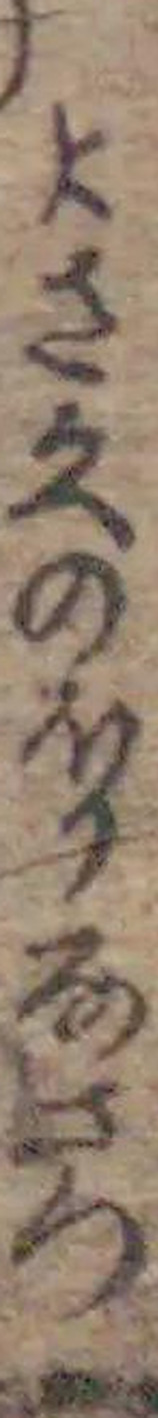大さかへのほりなさつ
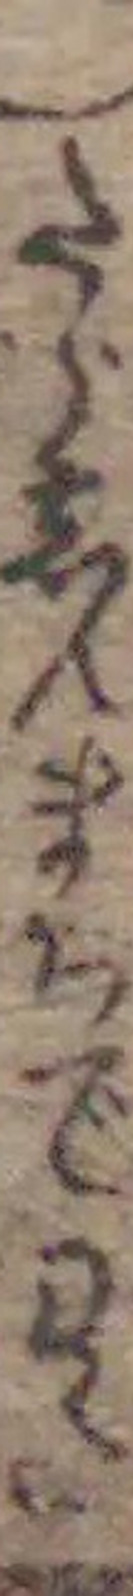たらしんまちでわた
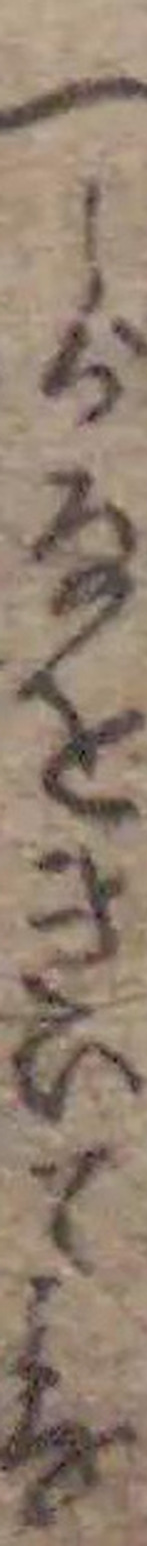しがなをきいてみな
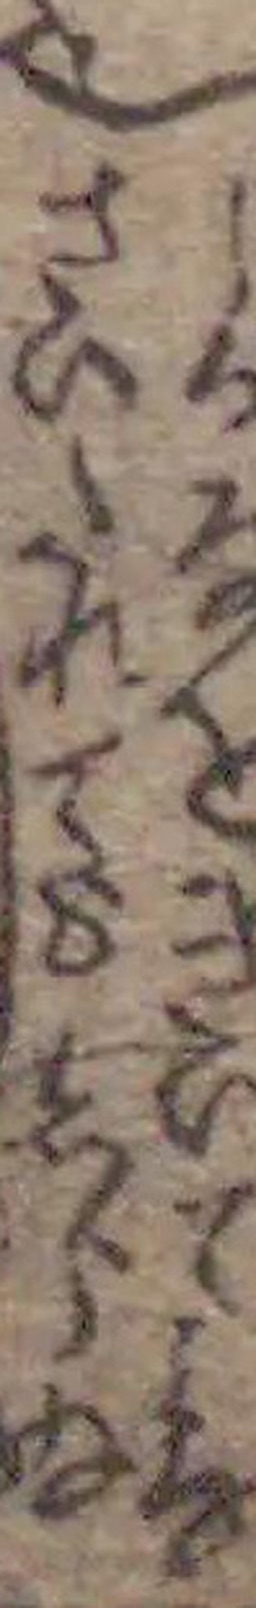さいたれてもしらぬ
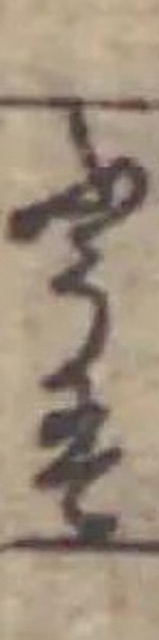ふうにて
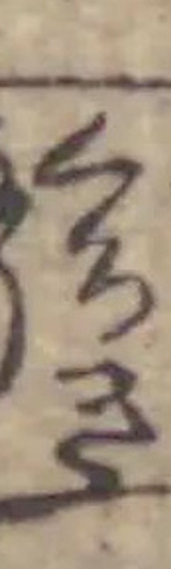くろき
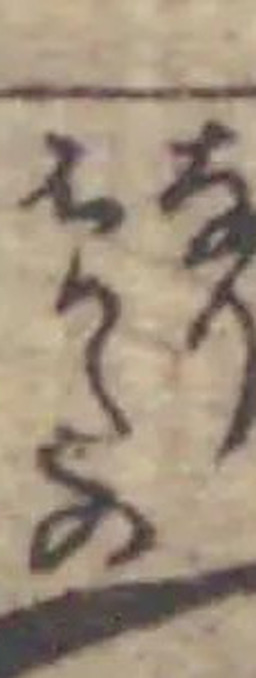はかたの
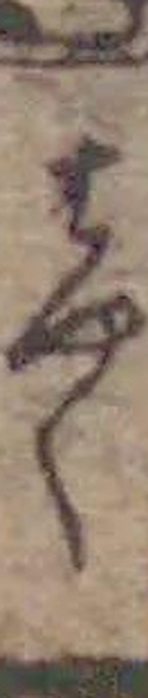はやく
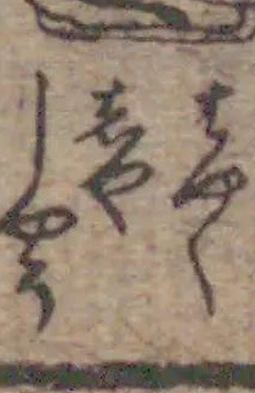しやう
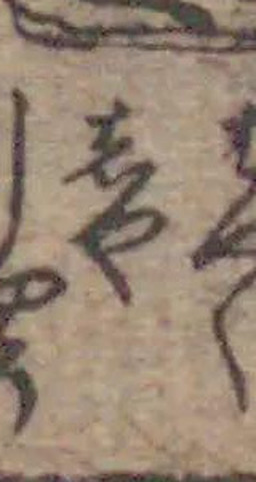しやう
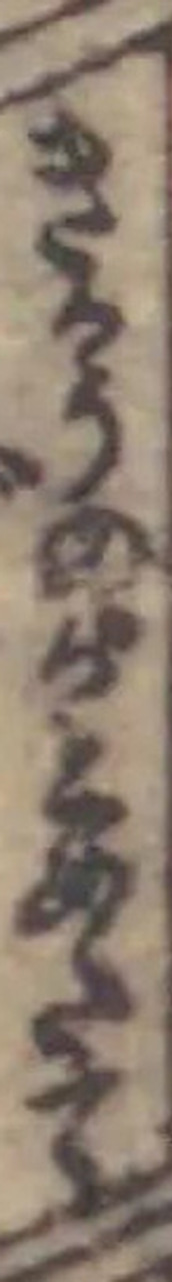きかうのがとめたて
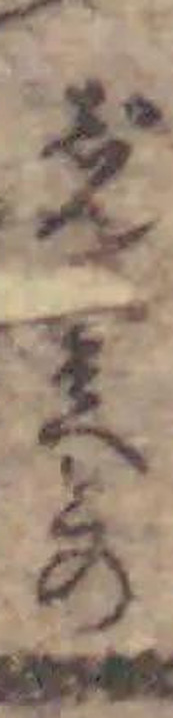じん五兵へとの

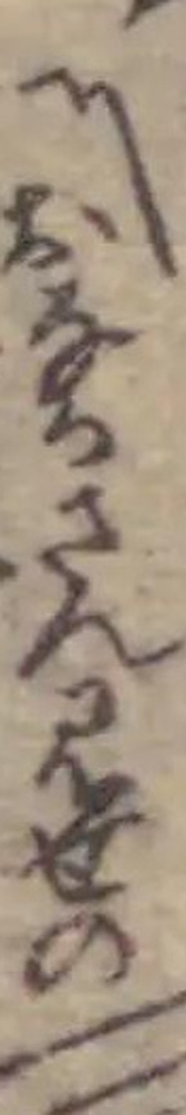「おなかさんみせの
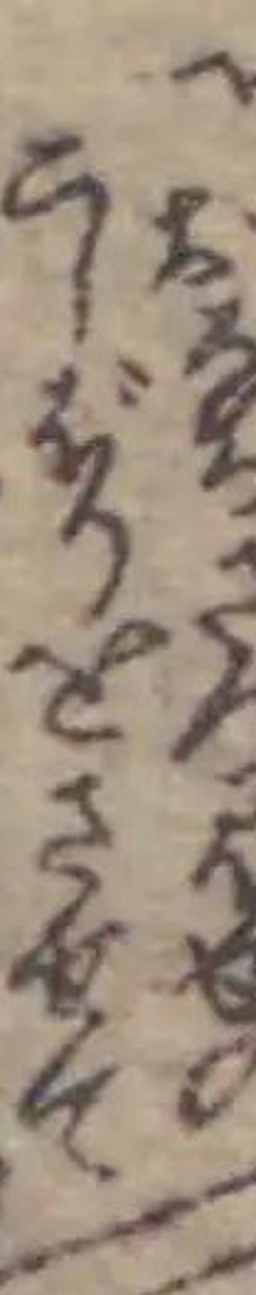こしばりをさせて
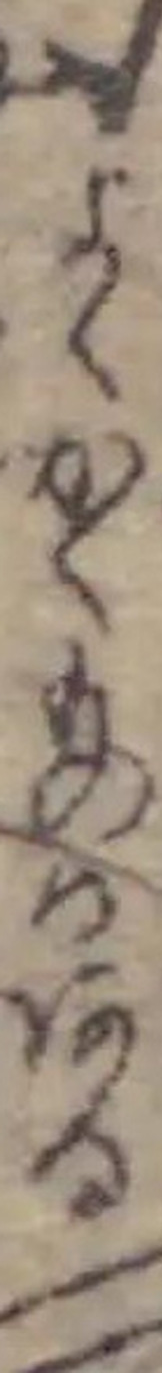よくかくものかある
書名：虚言弥二郎傾城誠 3巻
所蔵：国立国会図書館 National Diet Library, JAPAN
